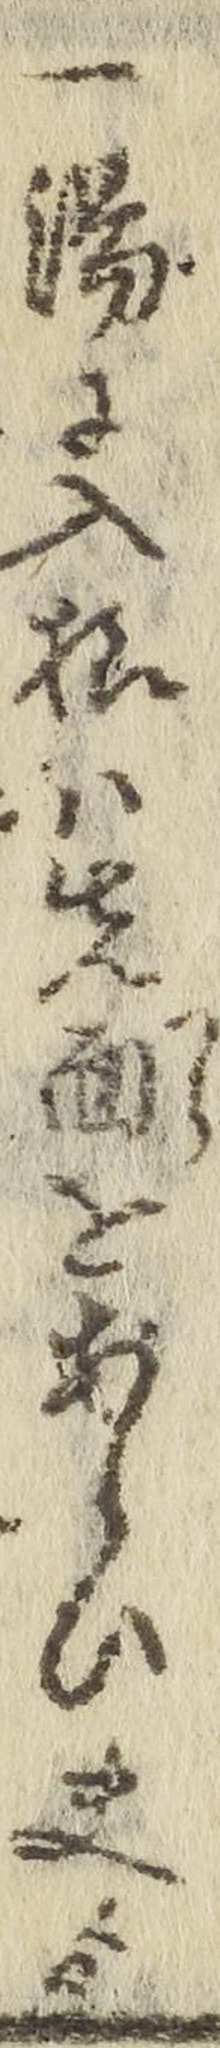一湯に入様は先面をあらひ夫より
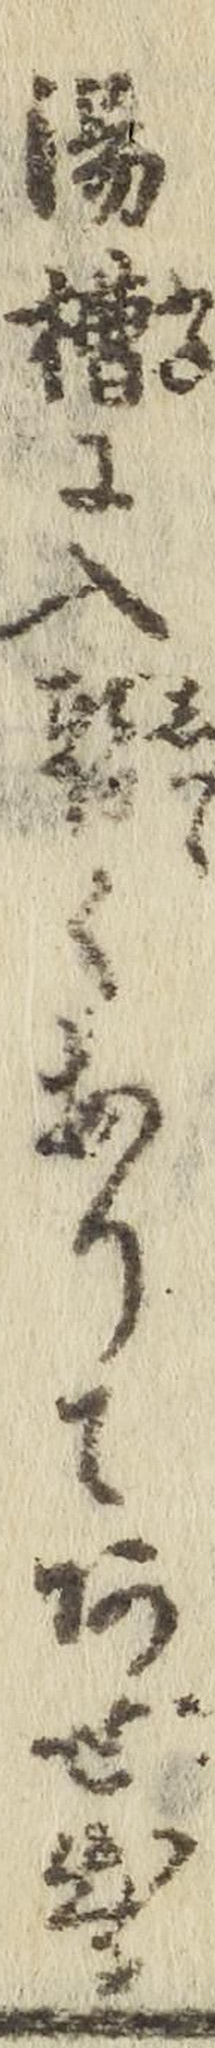湯槽に入暫くありてあせ出る
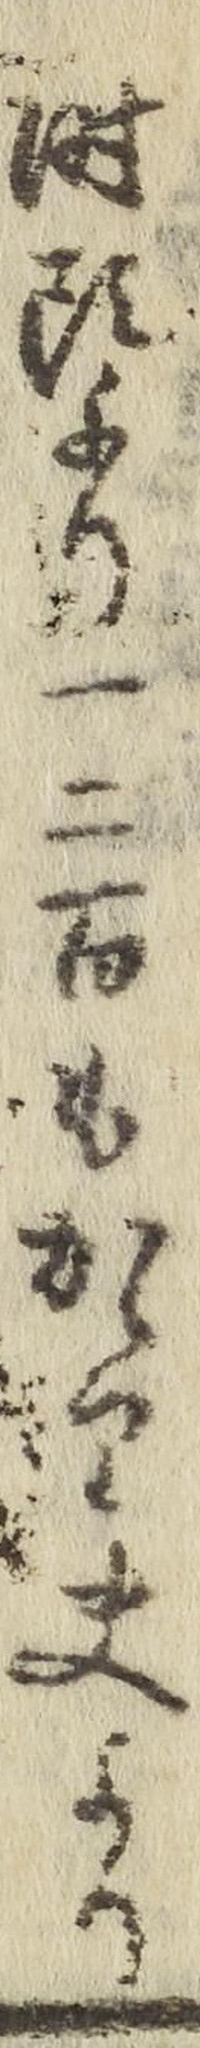時頭より一二百もかゝり夫より
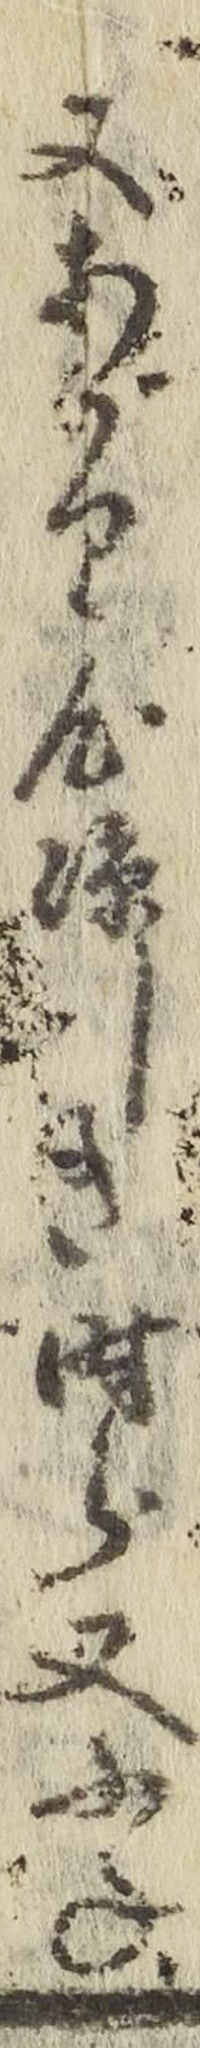又あがり心涼しき時には又ふね
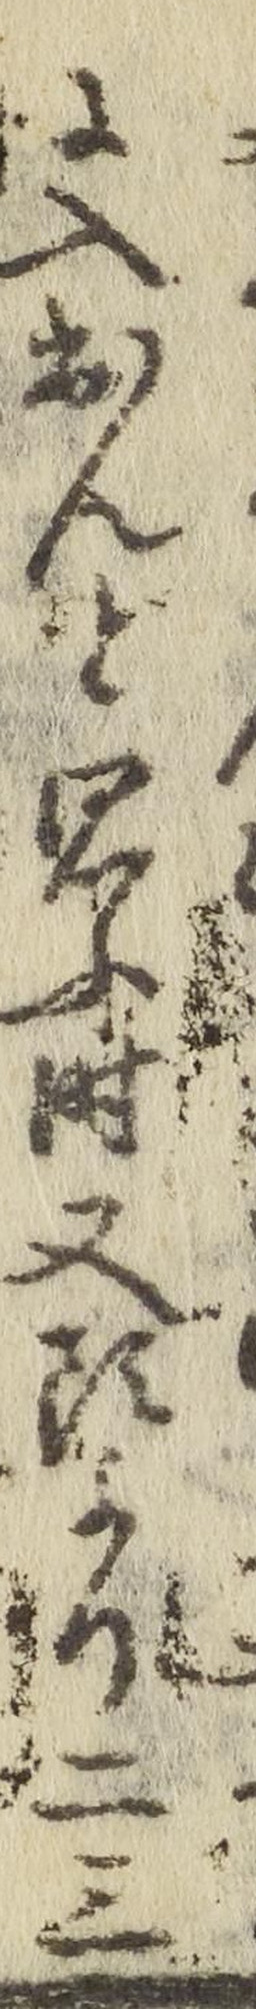に入出んと思ふ時又頭より二三
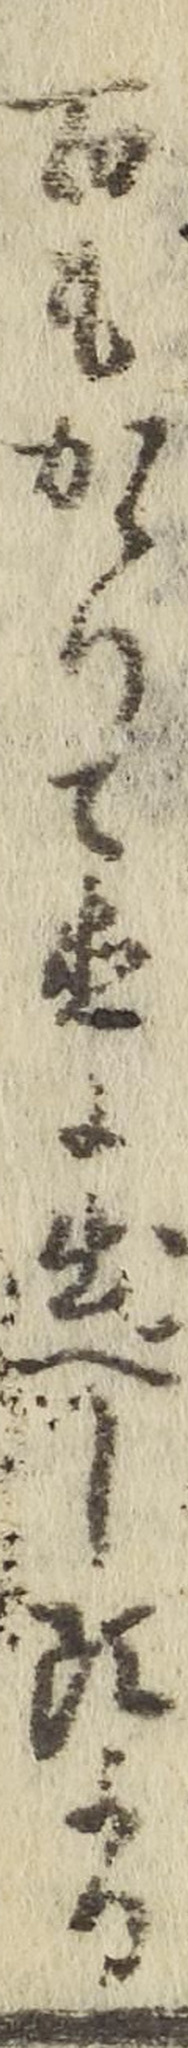百もかゝりて直に出べし頭より
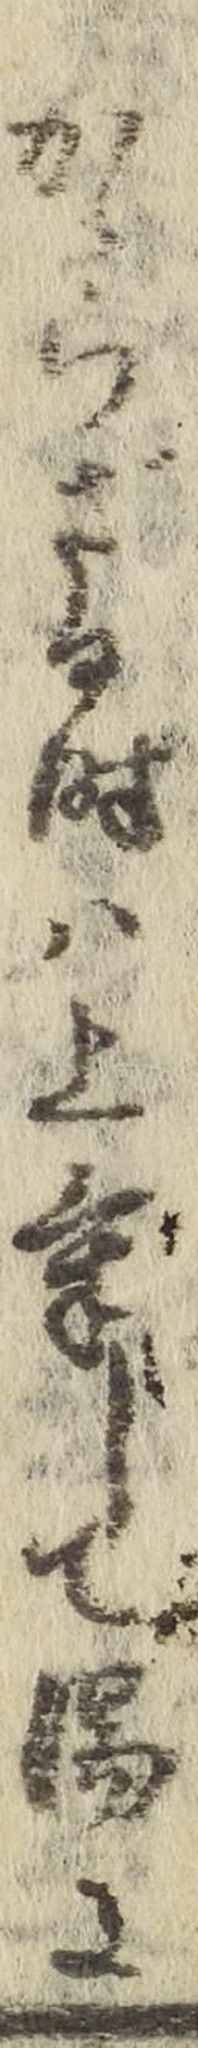かゝらざる時は上気して湯に
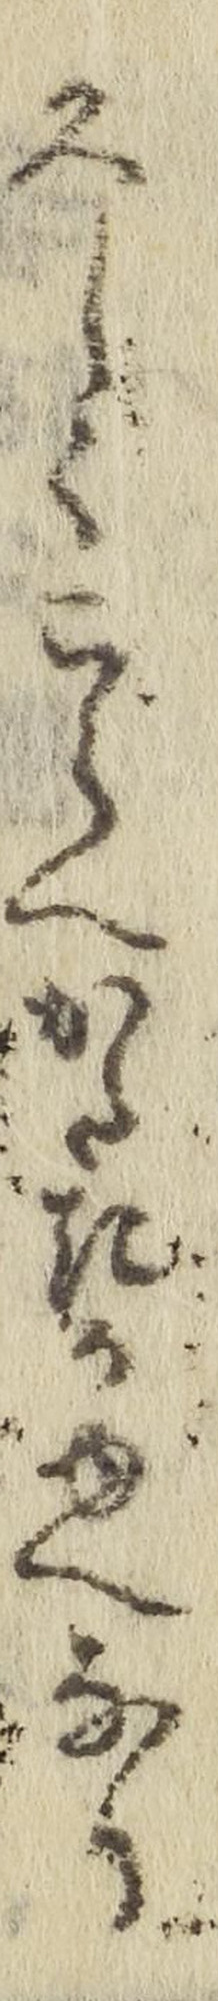久しくこらへかたきかゆへなり
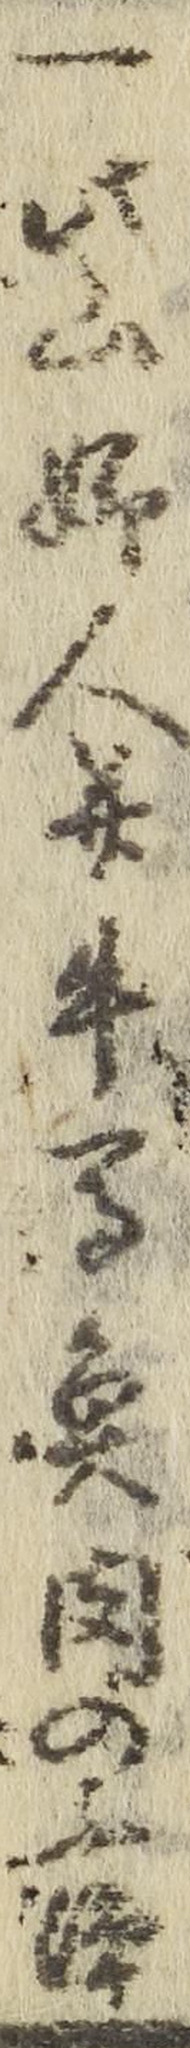一此山婦人幷牛馬魚肉の不浄
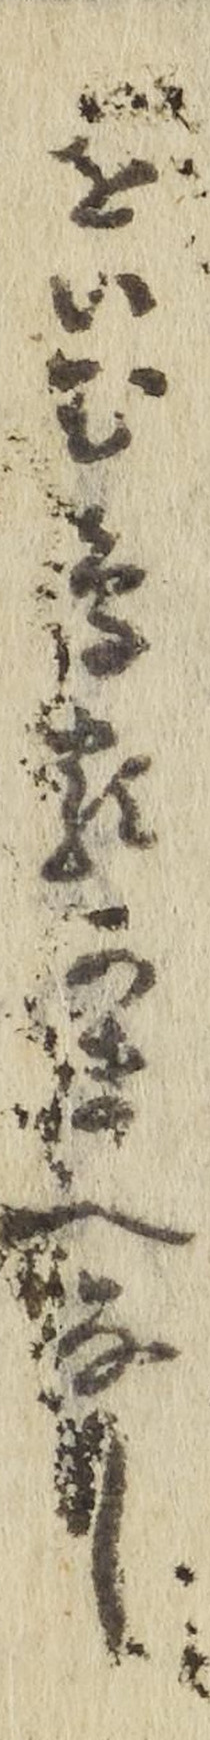をいむ鳥類かまへなし

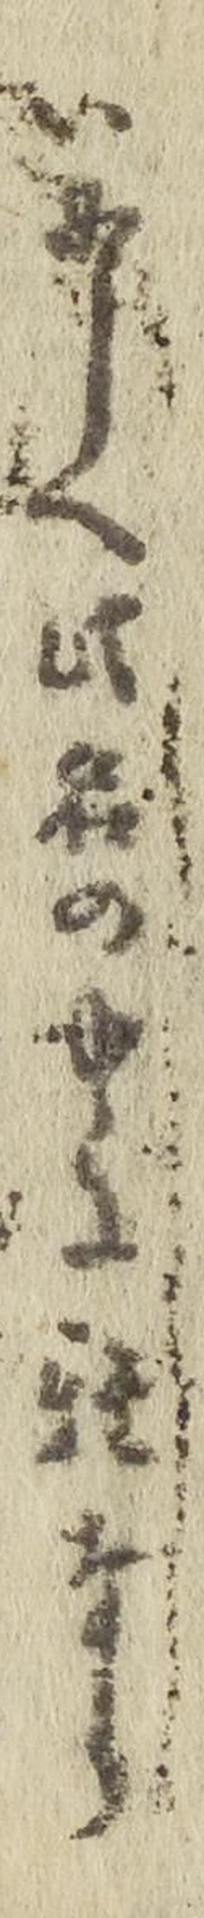いにしへ此名の由に軽なら
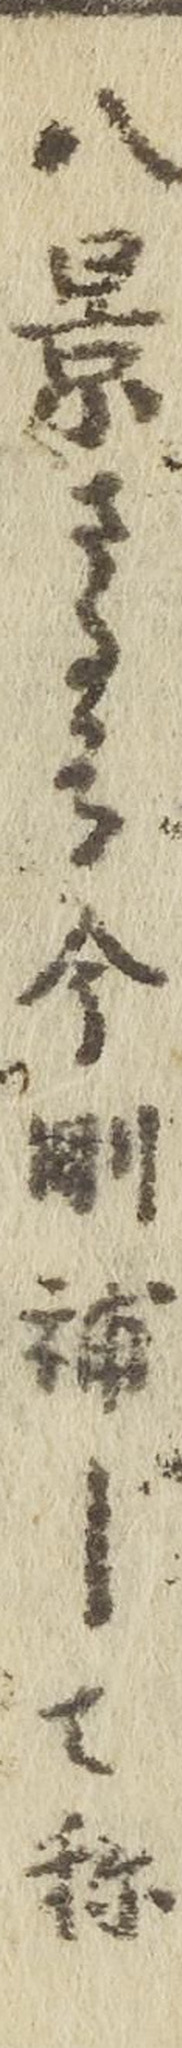八景さる有今刪補して称
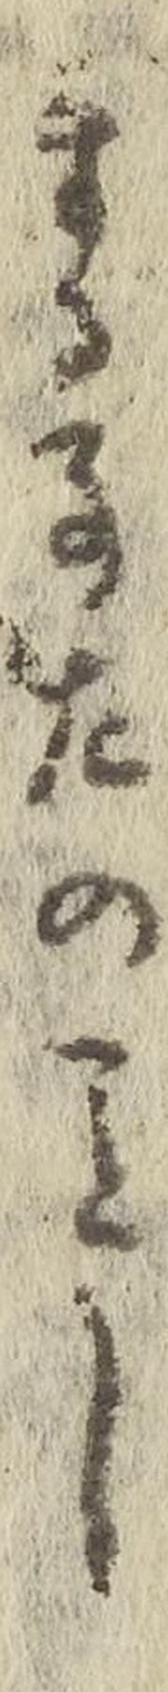する事左のことし
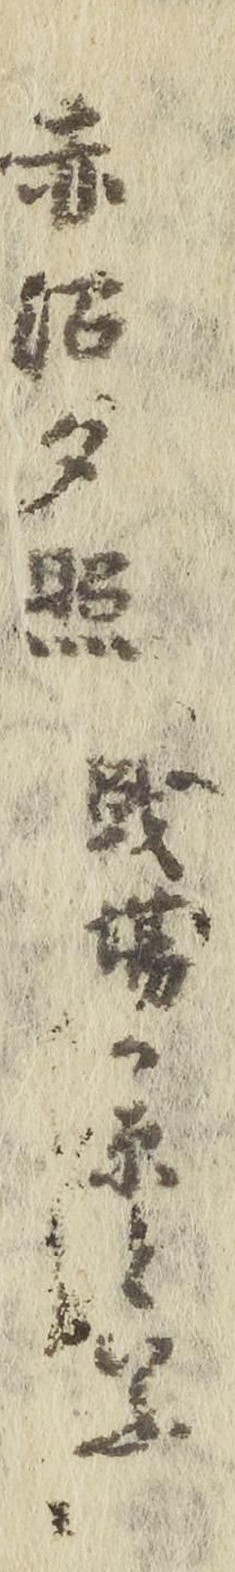赤沼夕照戦場か原といふ
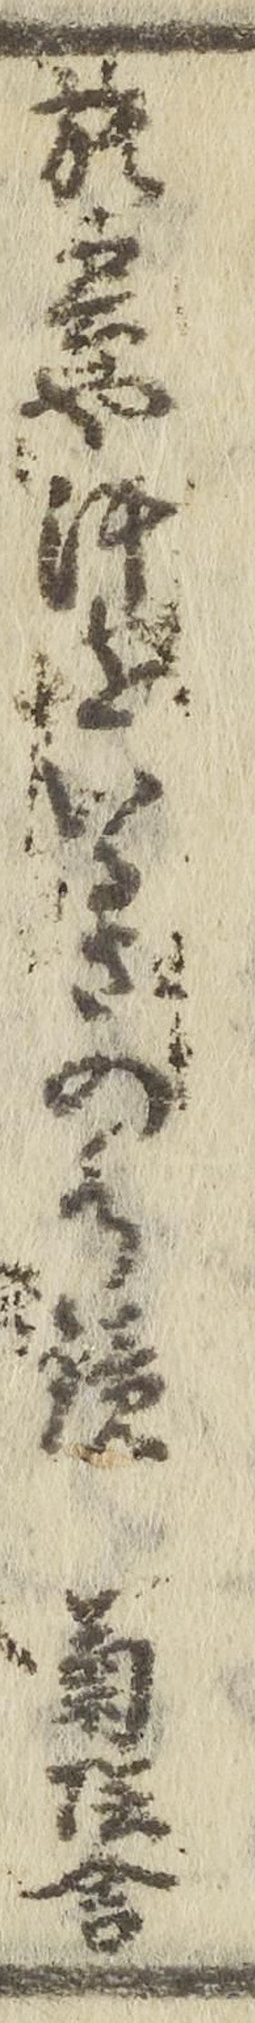旅雲や汗をいるさの水鏡菊陰舎
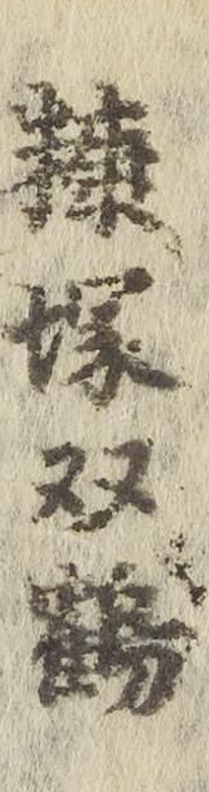糠塚双鶴
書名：日光山中禅寺　温泉記　全
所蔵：東京大学地震研究所図書室 Earthquake Research Institute Library, The University of Tokyo, JAPAN
